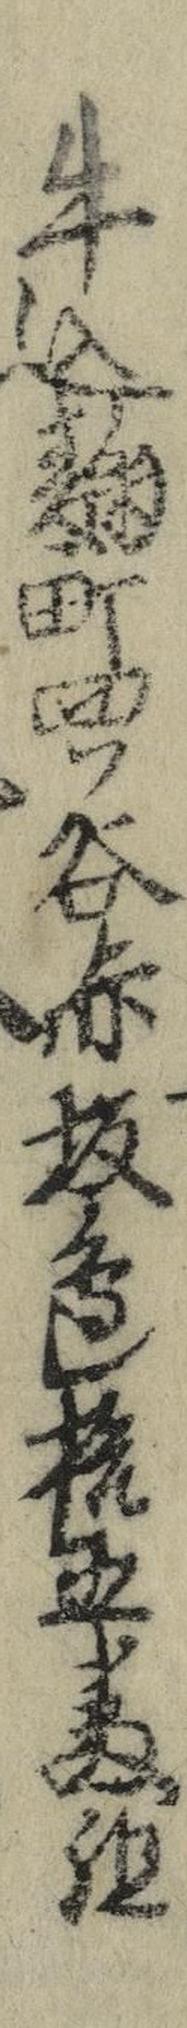牛込麹町四ツ谷赤坂辺拾五番組
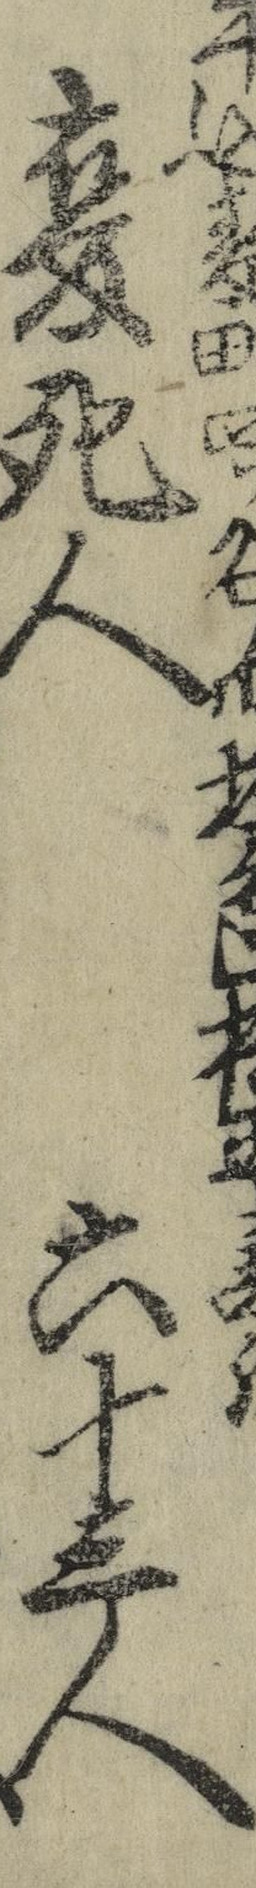変死人六十三人
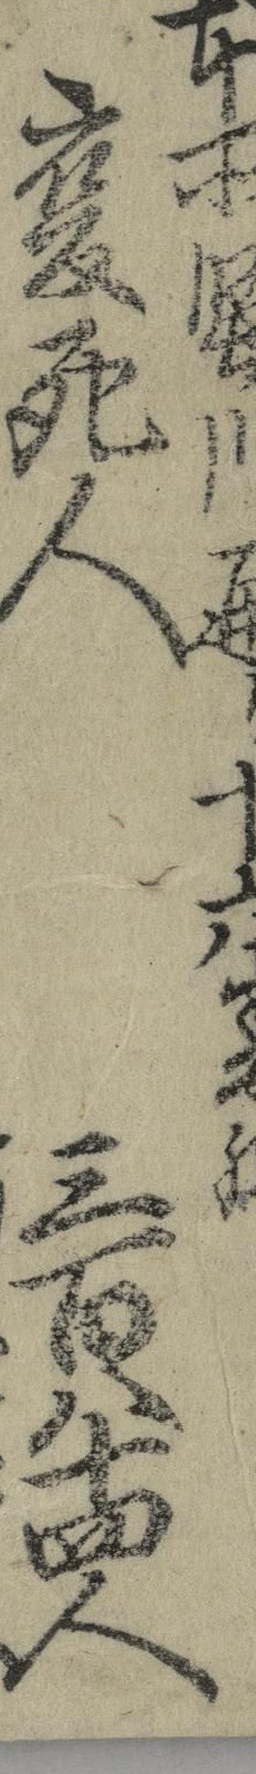変死人三百六十六人

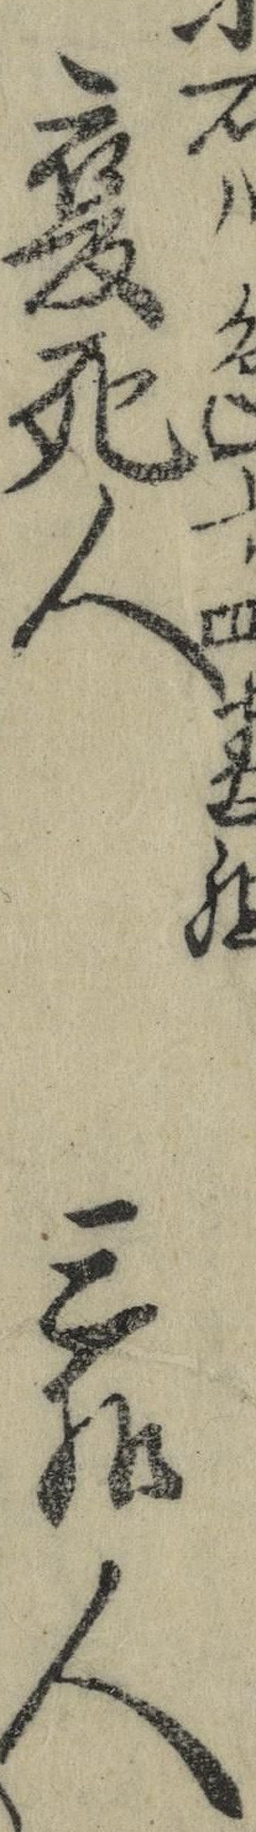変死人五人
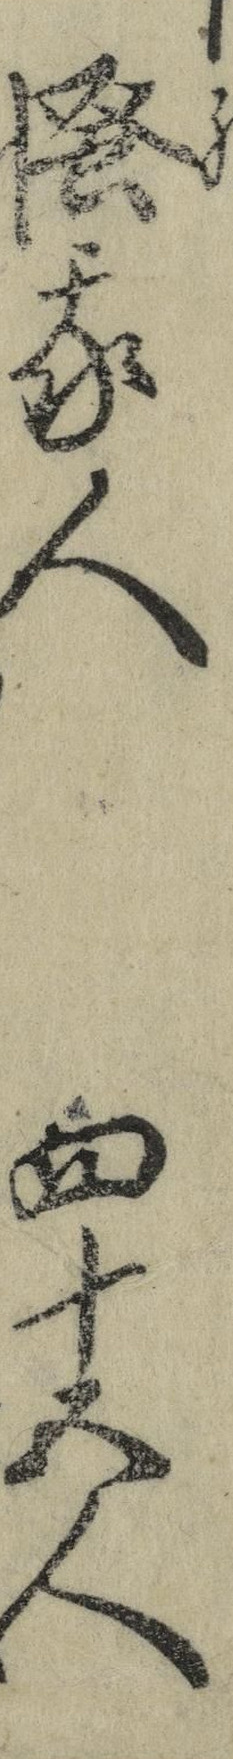怪我人九十六人
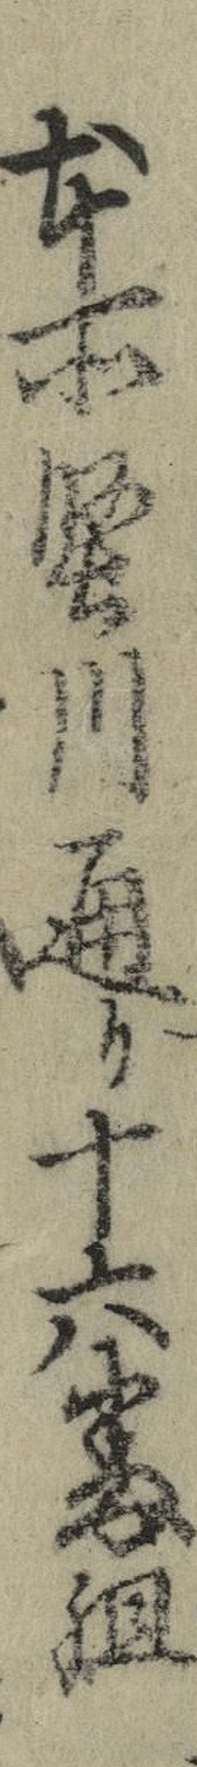本所竪川通り十六番組
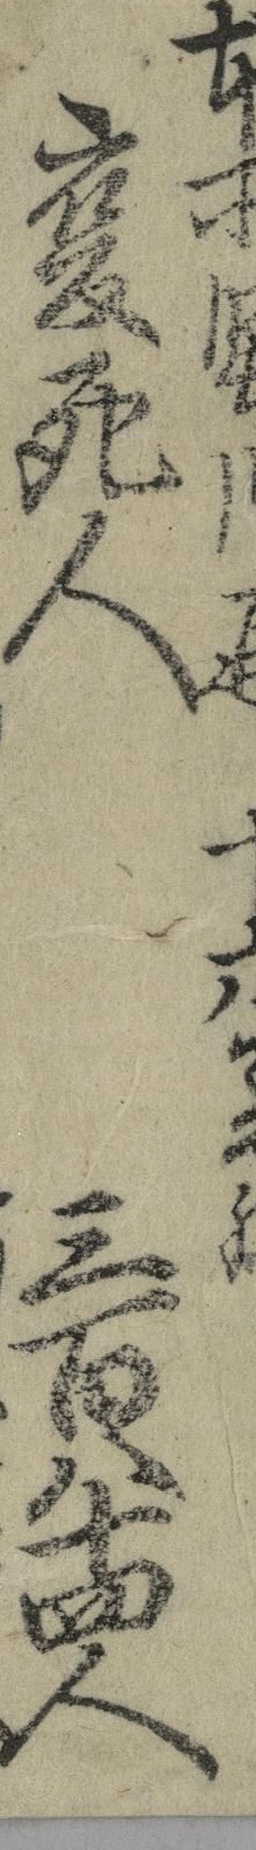変死人三百八十四人
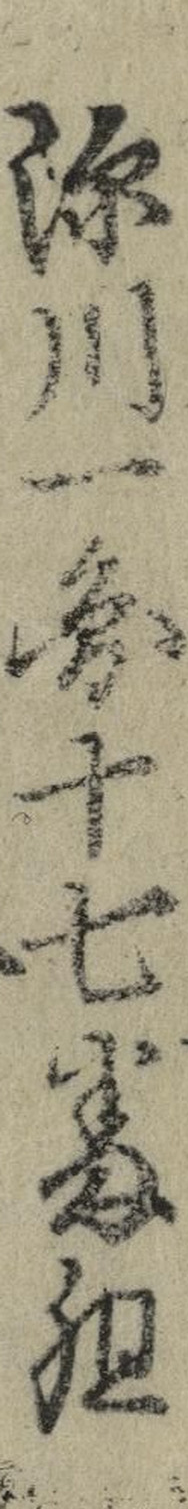深川一円十七番組
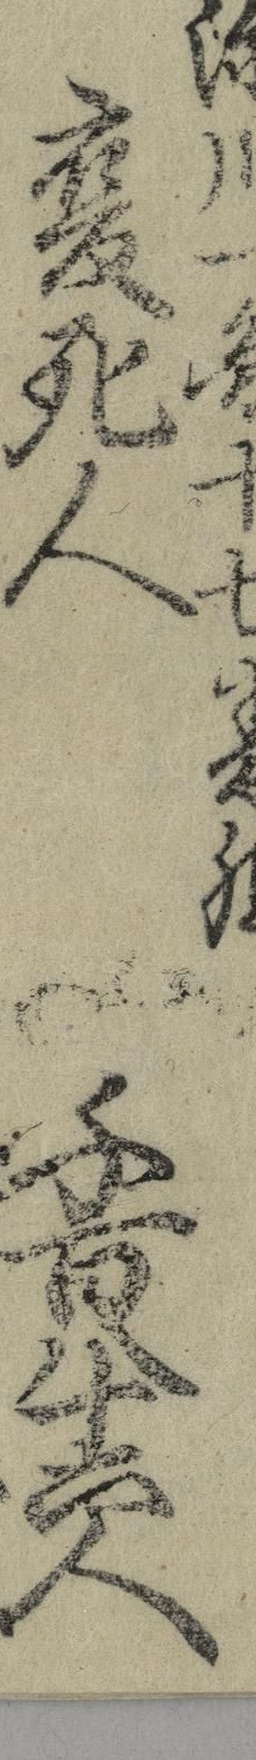変死人千百八十六人
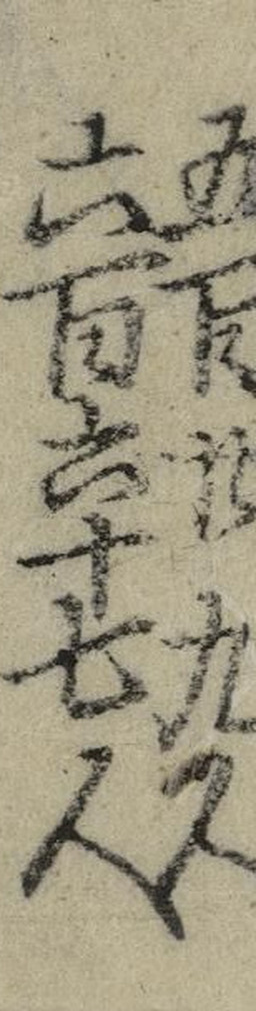女六百六十七人
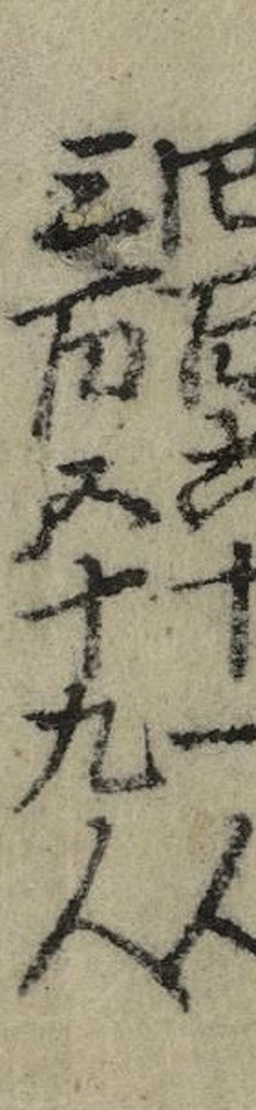女三百五十九人
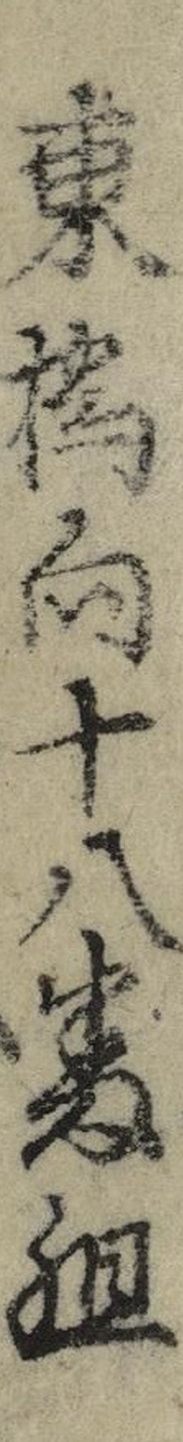東橋向十八番組
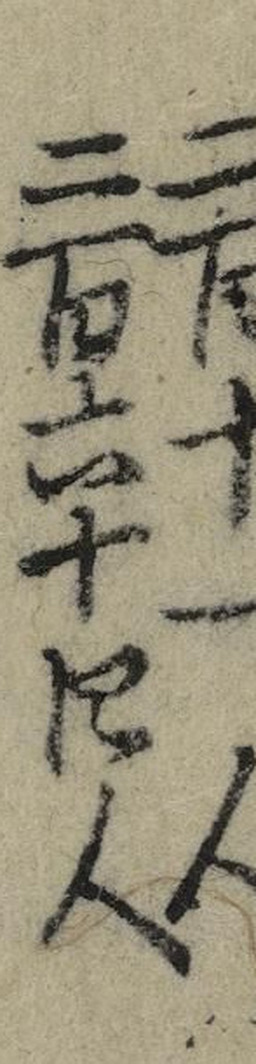女二百六十四人
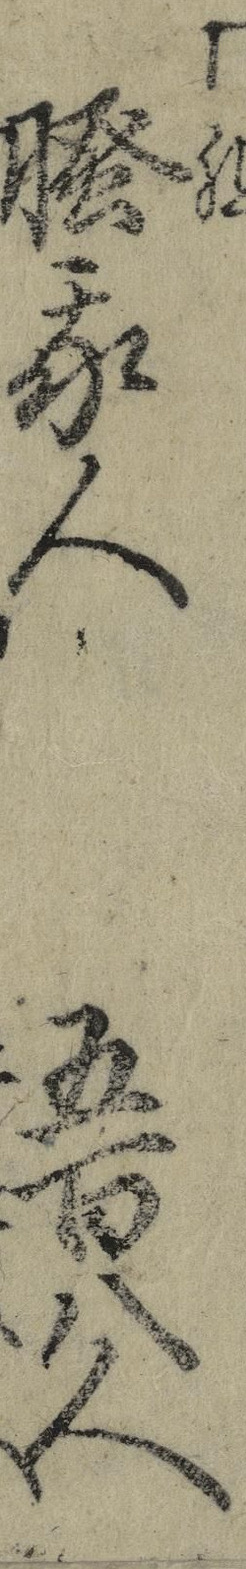怪我人五百八人
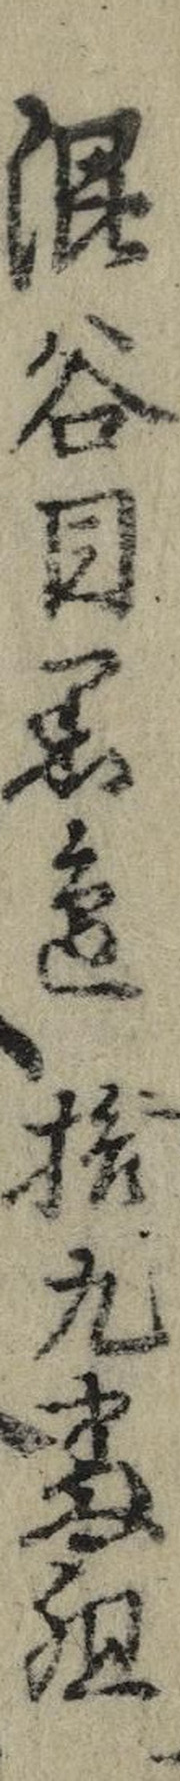渋谷目黒辺拾九番組
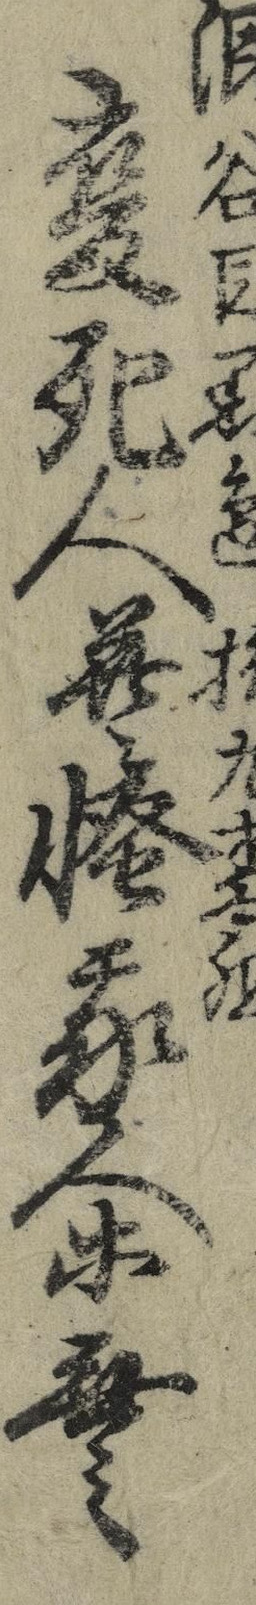変死人并怪我人等無
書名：地震出火　男女死人怪我人書上之冩
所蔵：東京大学地震研究所図書室 Earthquake Research Institute Library, The University of Tokyo, JAPAN
